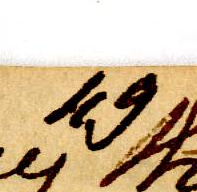49
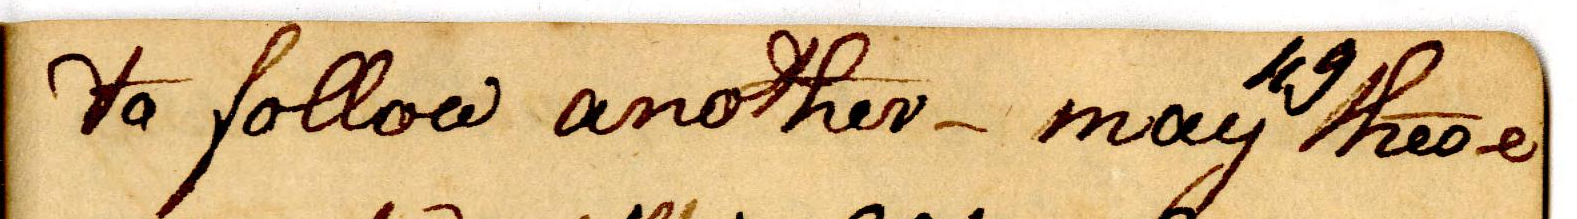to follow another- may these
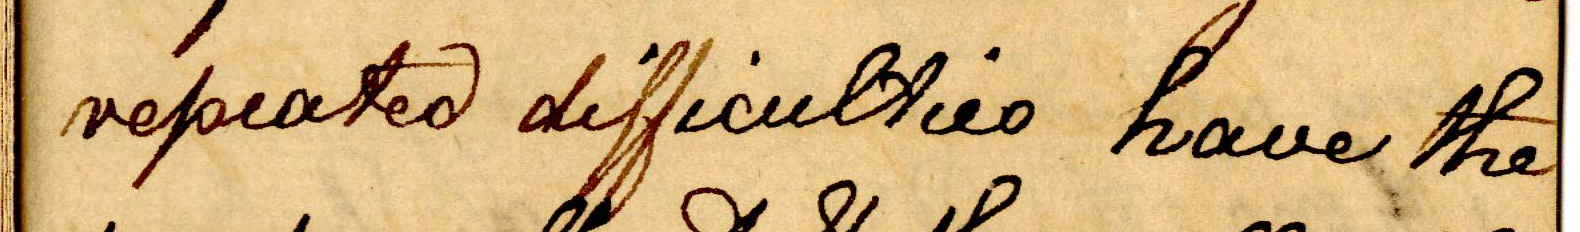repeated difficulties have the
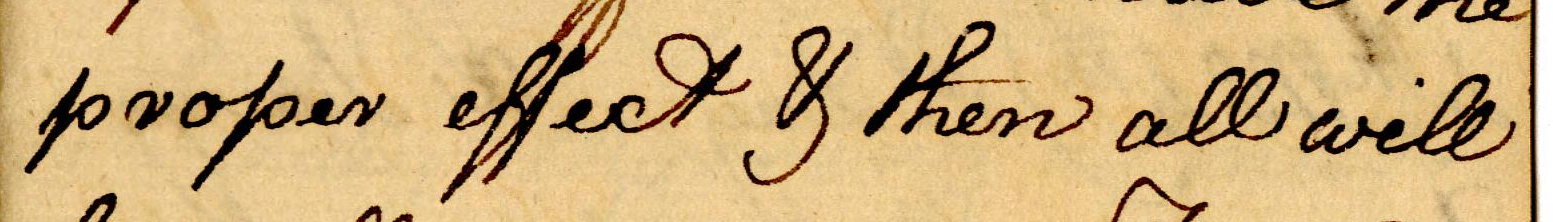proper effect & then all will
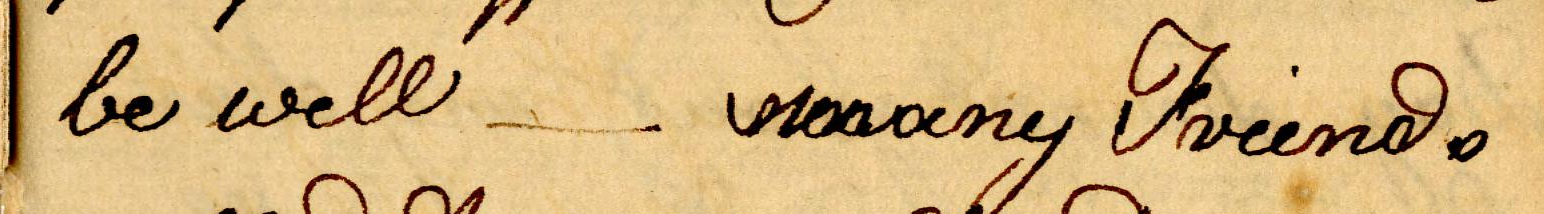be well- many Friends
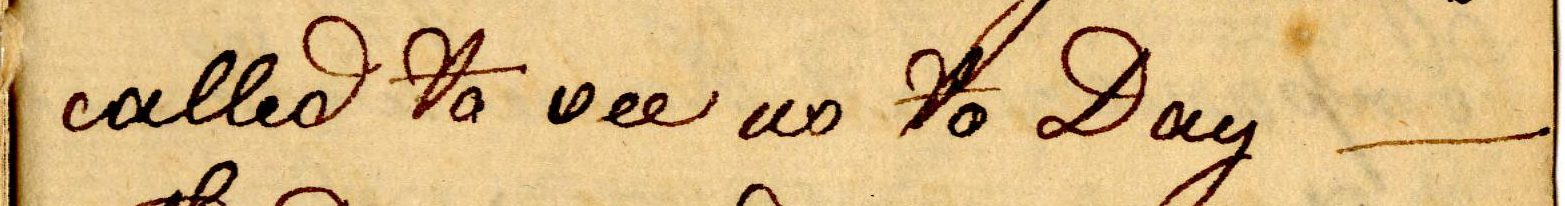called to see us to Day-
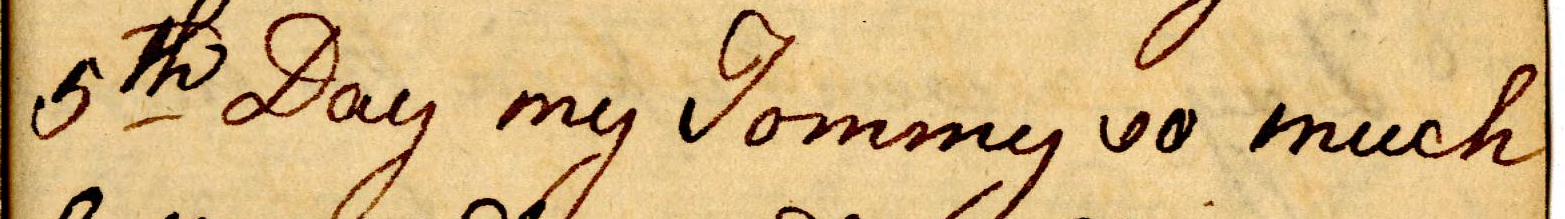5^th Day my Tommy so much
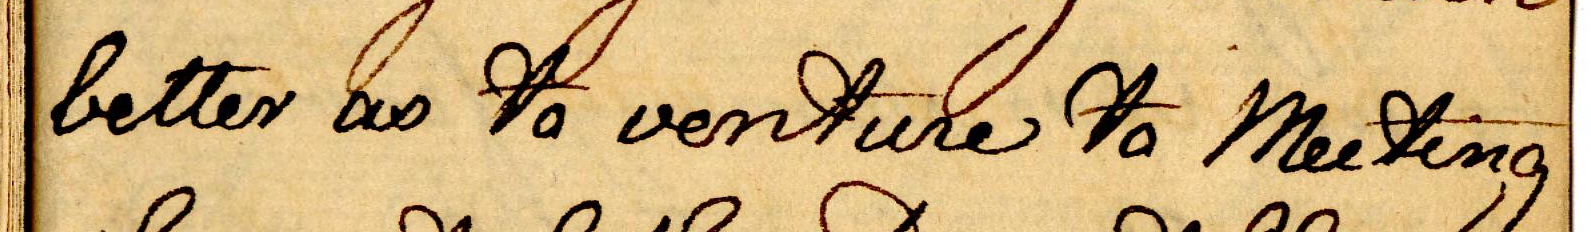better as to venture to Meeting
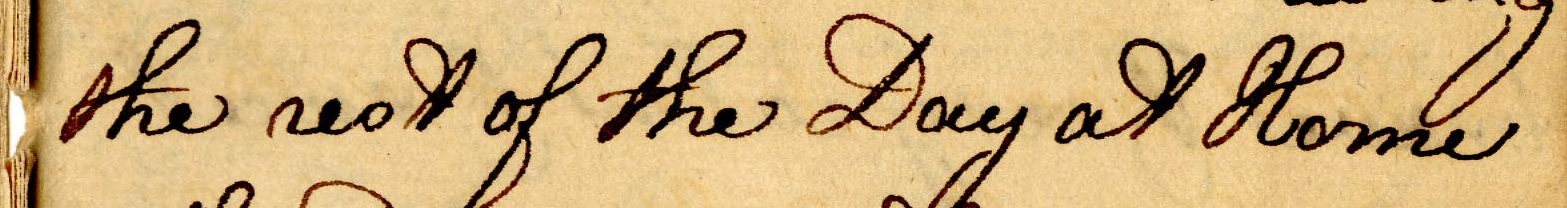the rest of the Day at Home
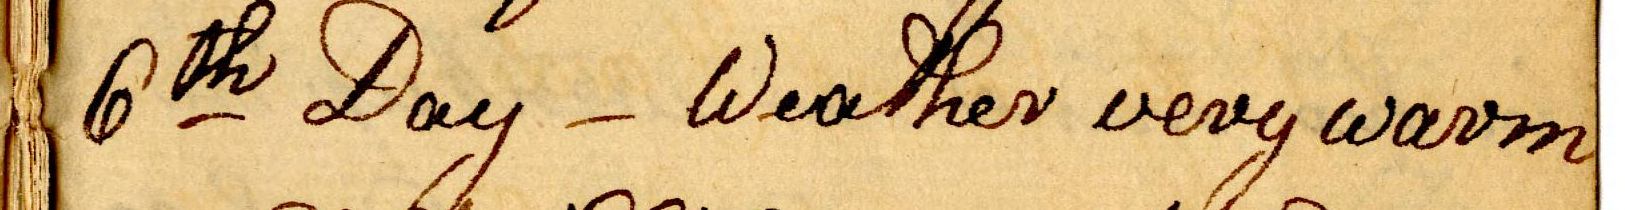6^th- Day- Weather very warm
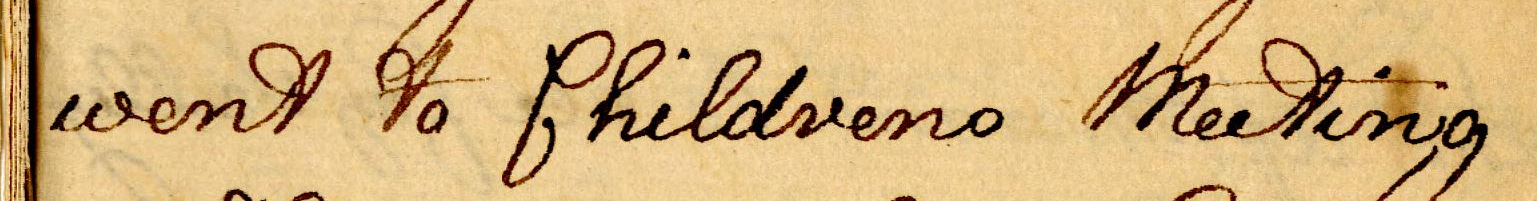went to Childrens Meeting
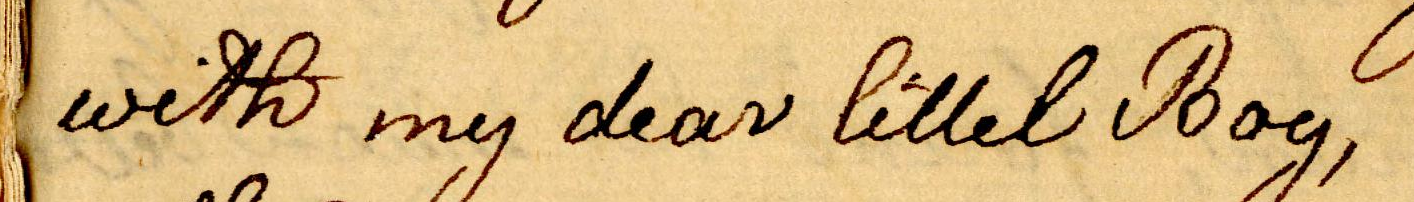with my dear littel Boy,
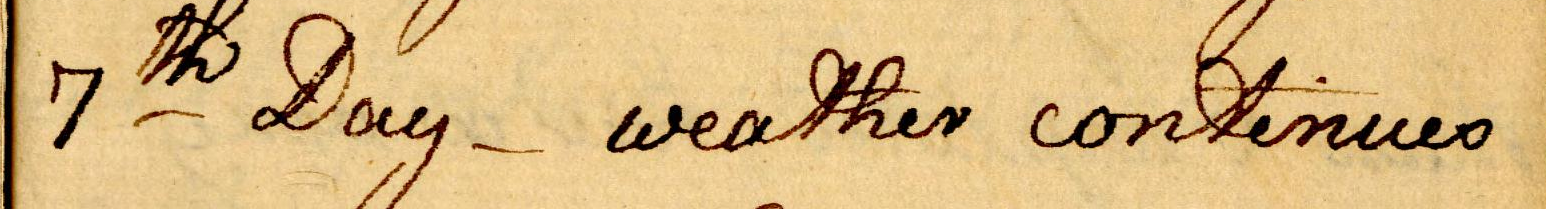7^th- Day- weather continues
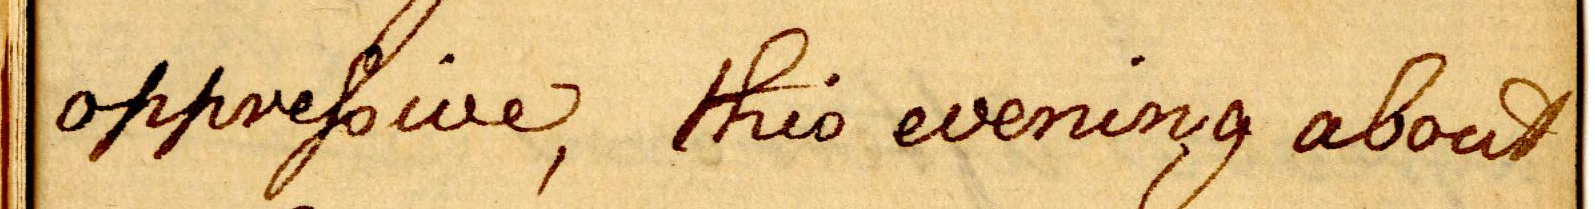oppressive, this evening about
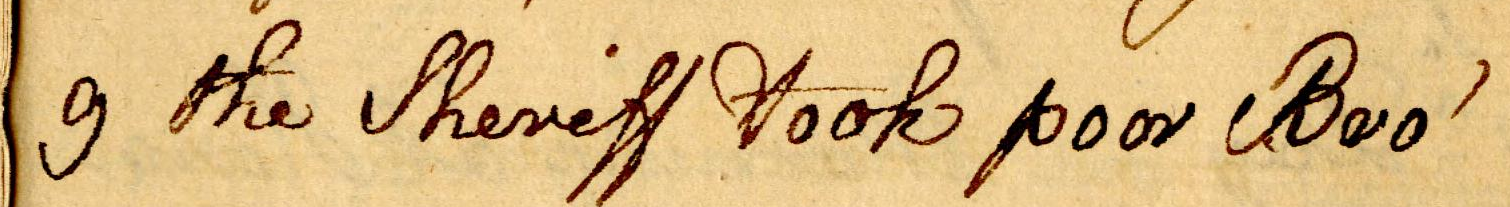9 the Sheriff took poor Bro'
